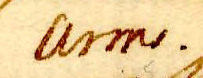Arms.
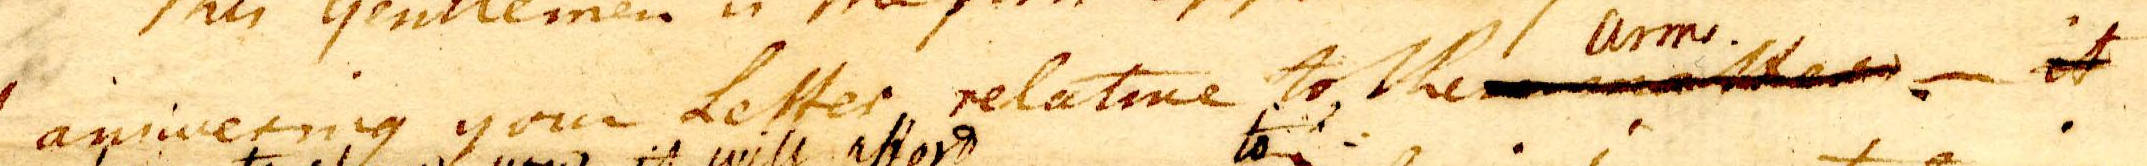answering your Letter, relative to the ^ [_________]. [it]
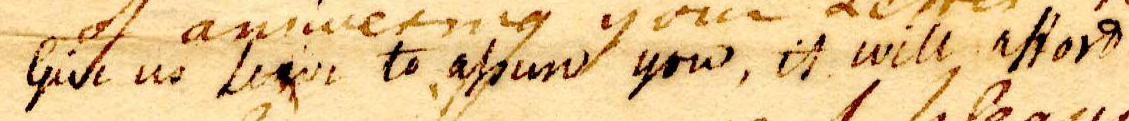Give us Leave to assure you, it will afford
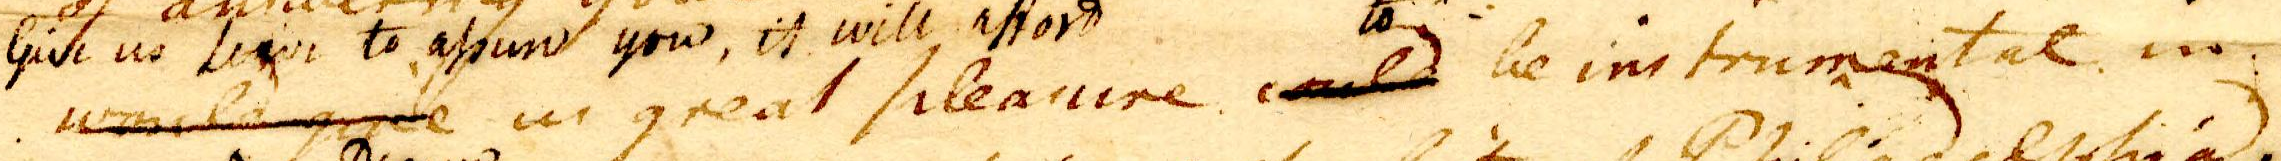[would give] ^ us great pleasure [could] ^ be instrumental in
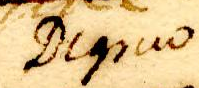Degree
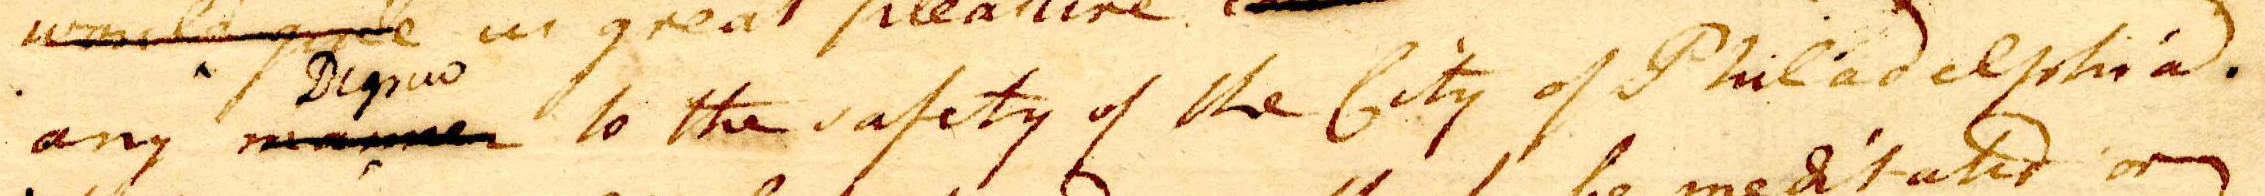any [manner] ^ to the safety of the City of Philadelphia.
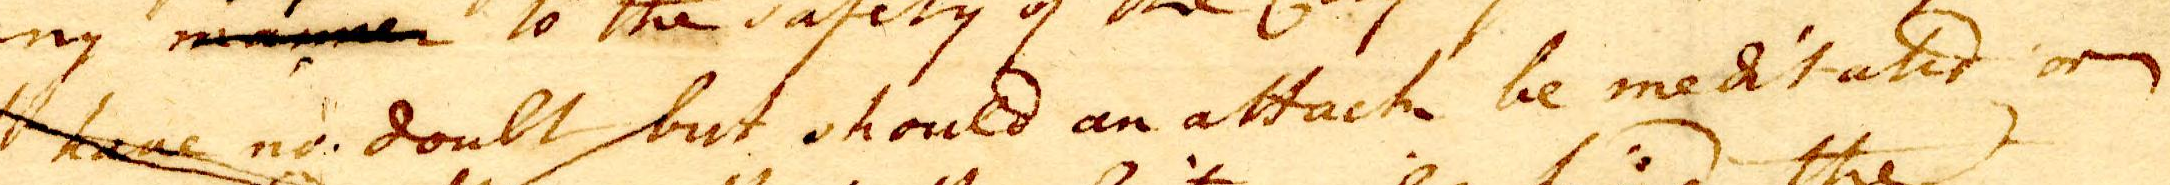I have no doubt but should an attack be meditated or
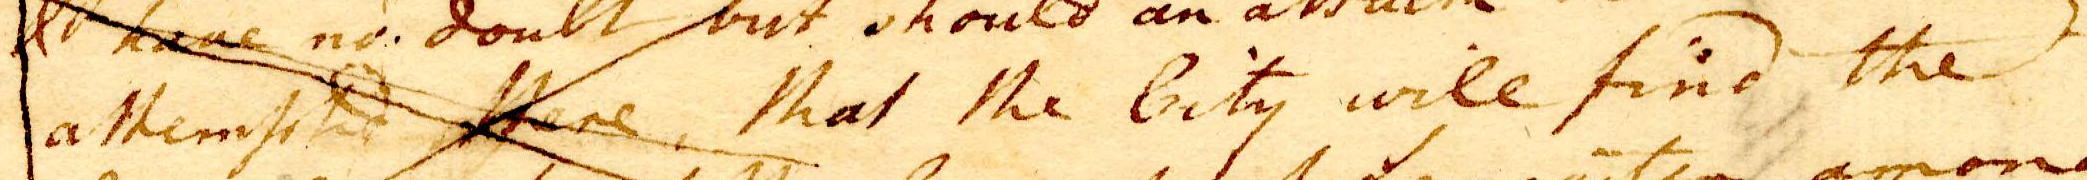attempted there, that the City will find the
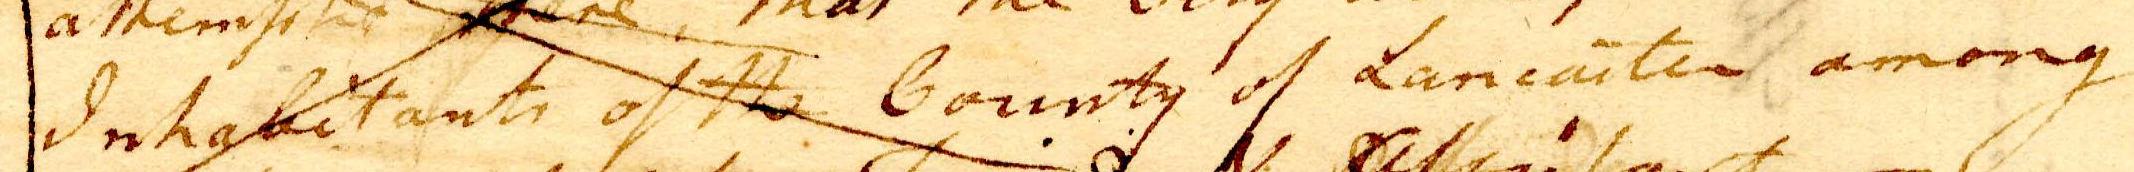Inhabitants of the County of Lancaster among
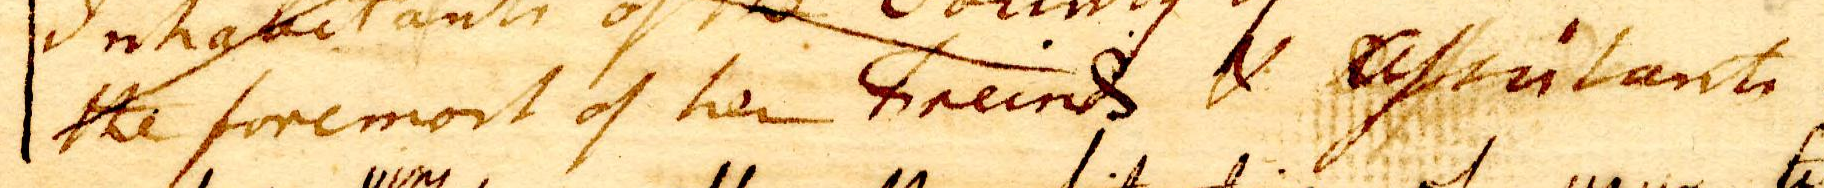the foremost of her Friends & Assistants
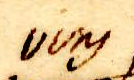very
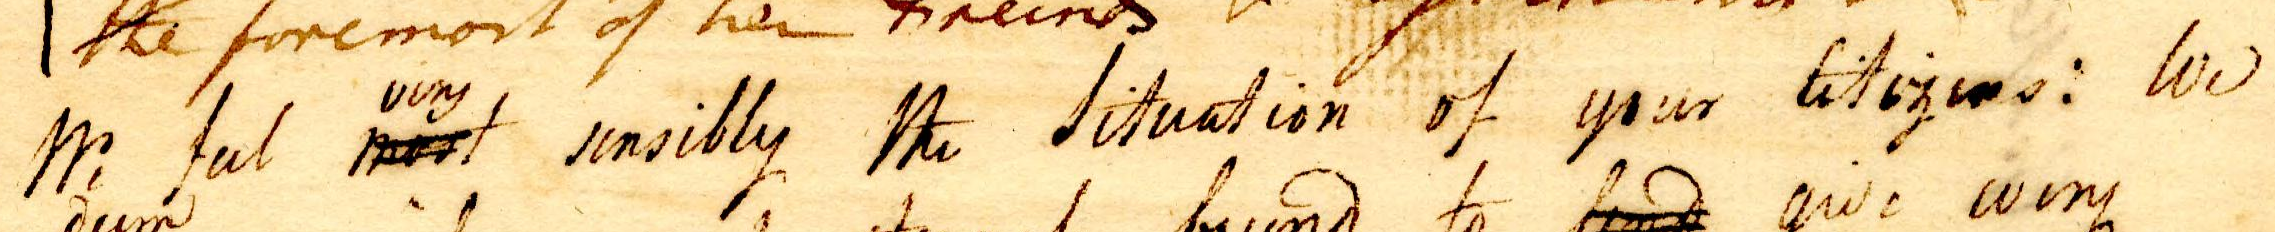We feel [most] sensibly the Situation of your Citizens: We
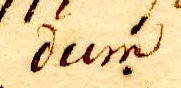deem
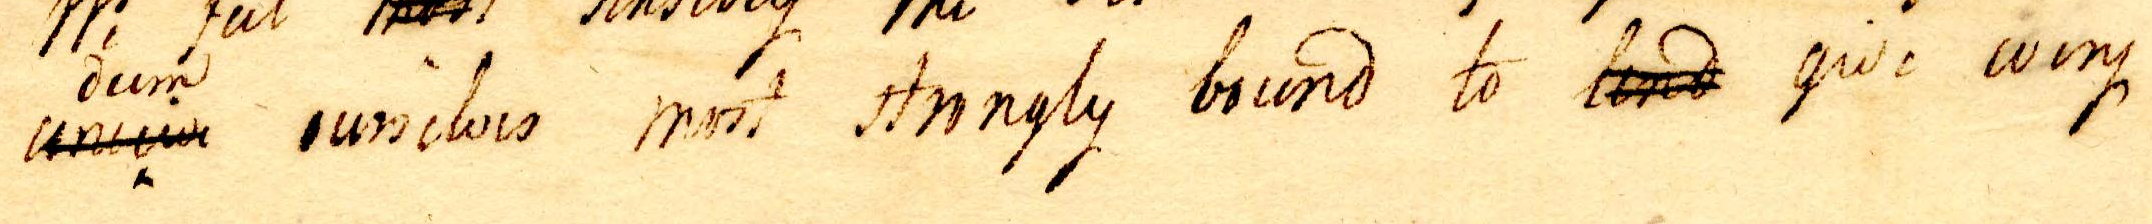[conceive] ^ ourselves most strongly bound to [lend] give every
